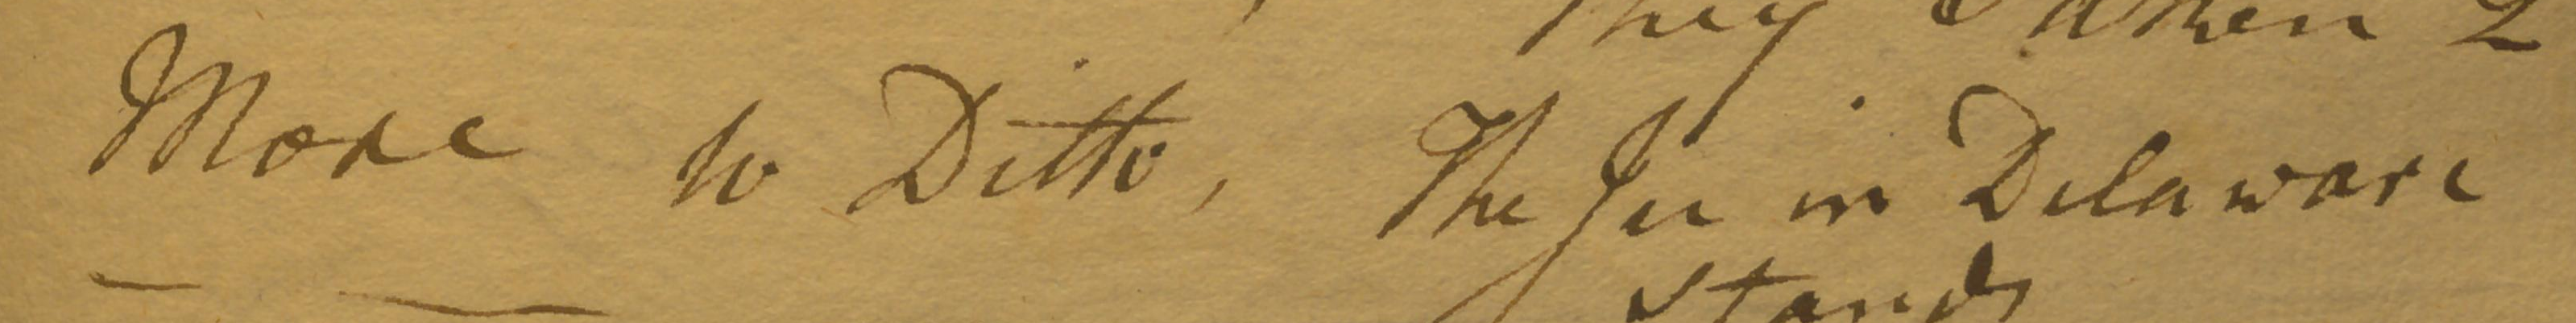More to Ditto, The Ice in Delaware
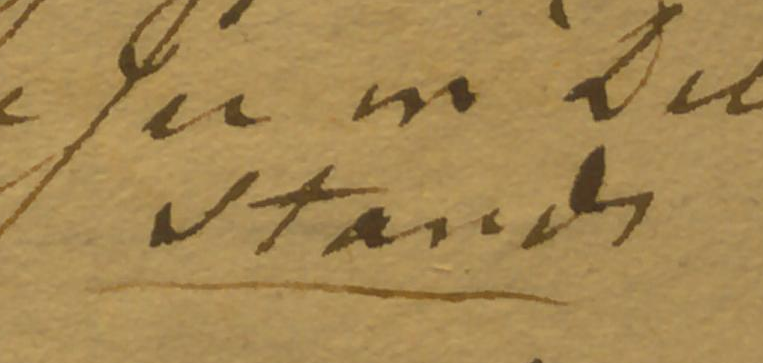stands
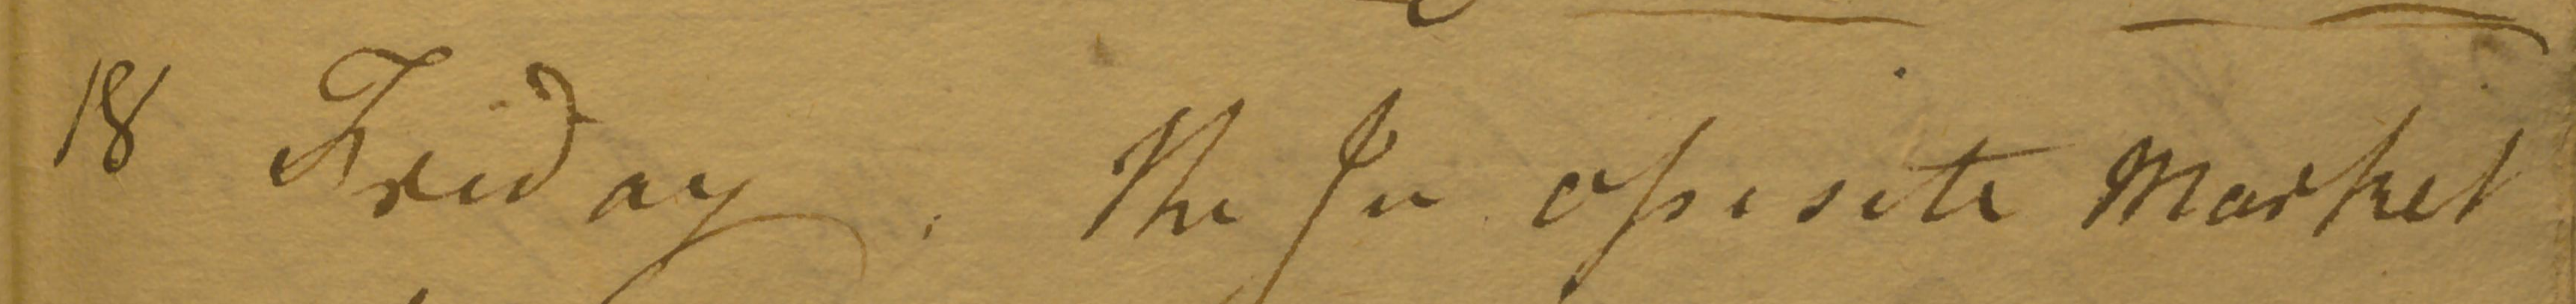18 Friday the Ice opesite Market
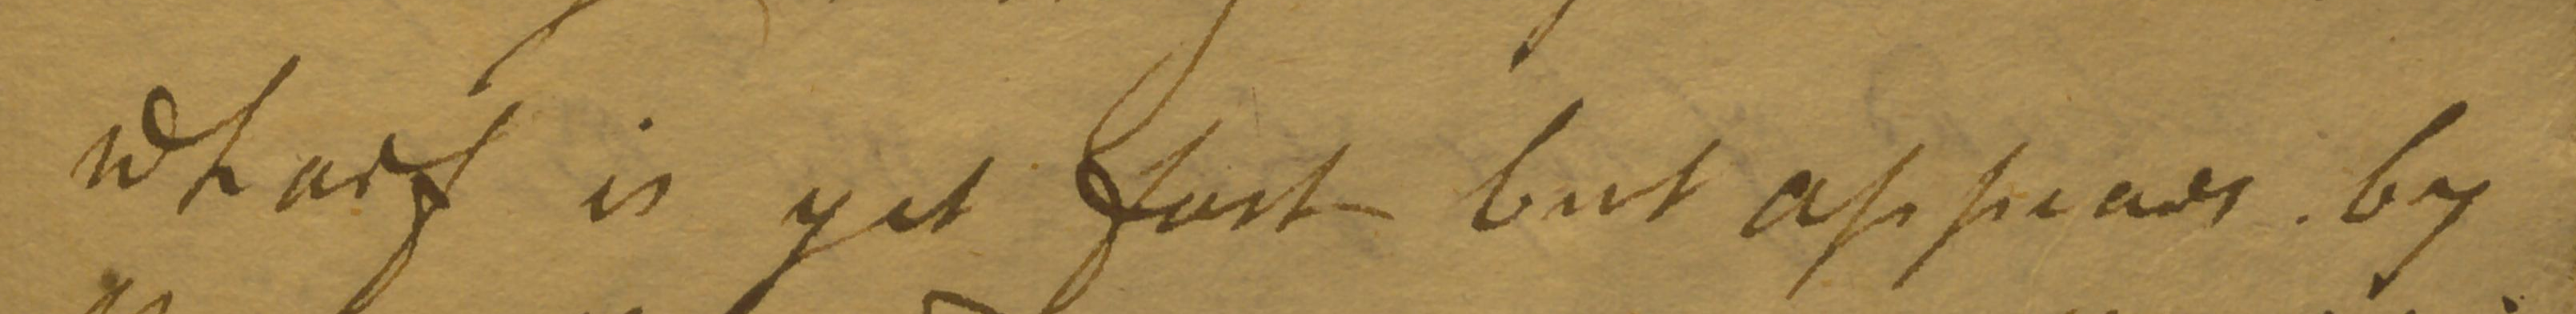wharf is yet fast but appears by
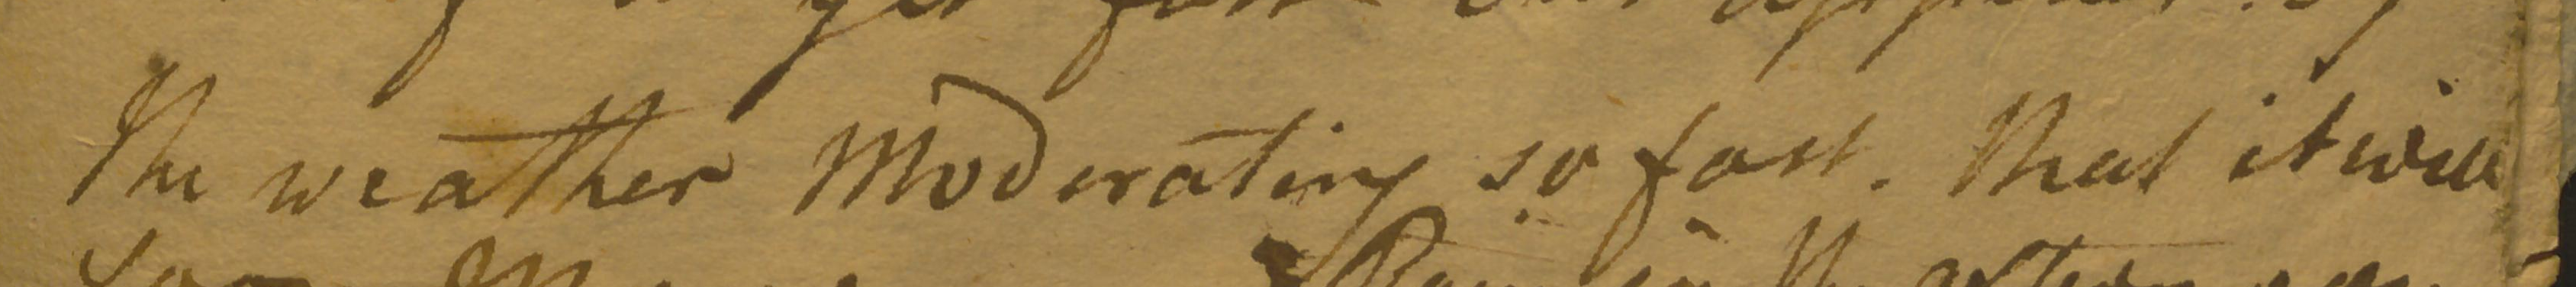the weather Moderating so fast. that it will
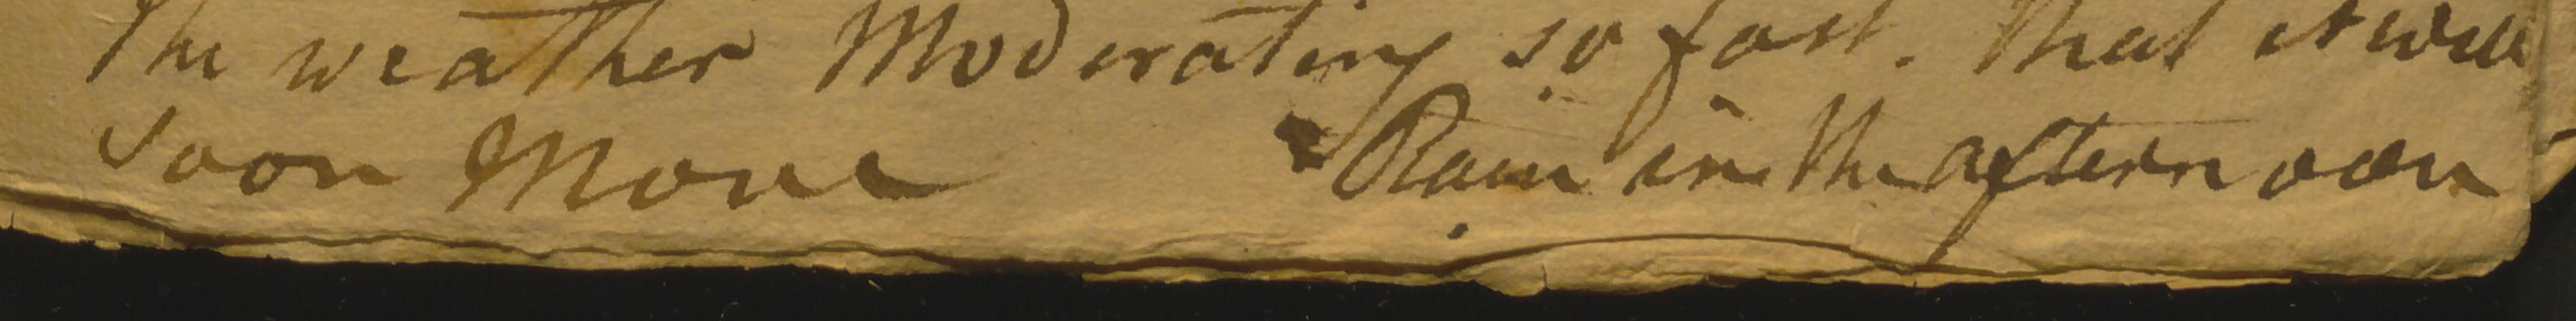soon Move Rain in the afternoon
